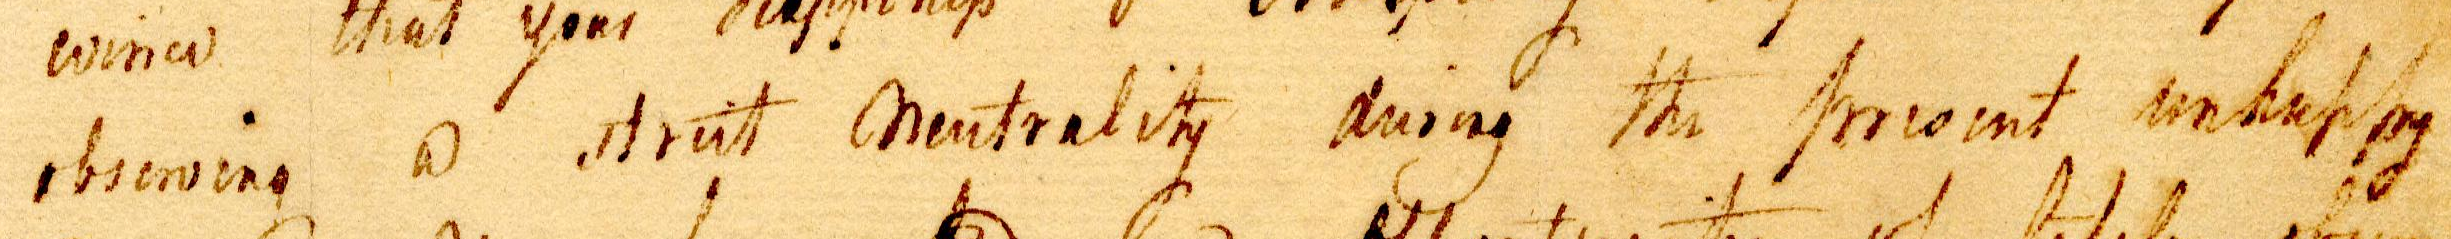observing a strict Neutrality during the present unhappy
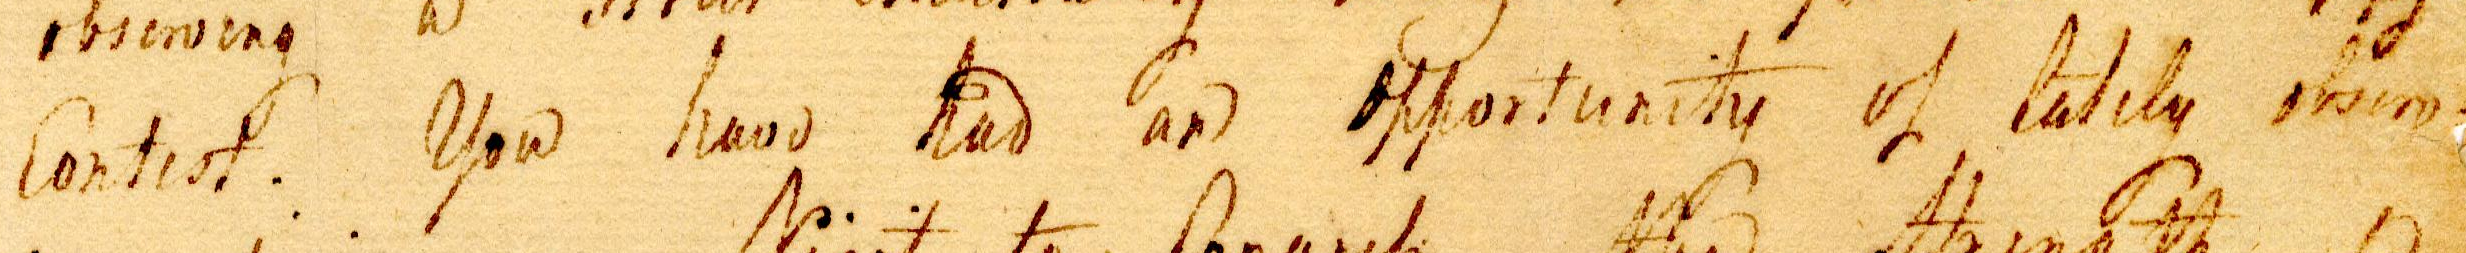Contest. You have had an Opportunity of lately observ-
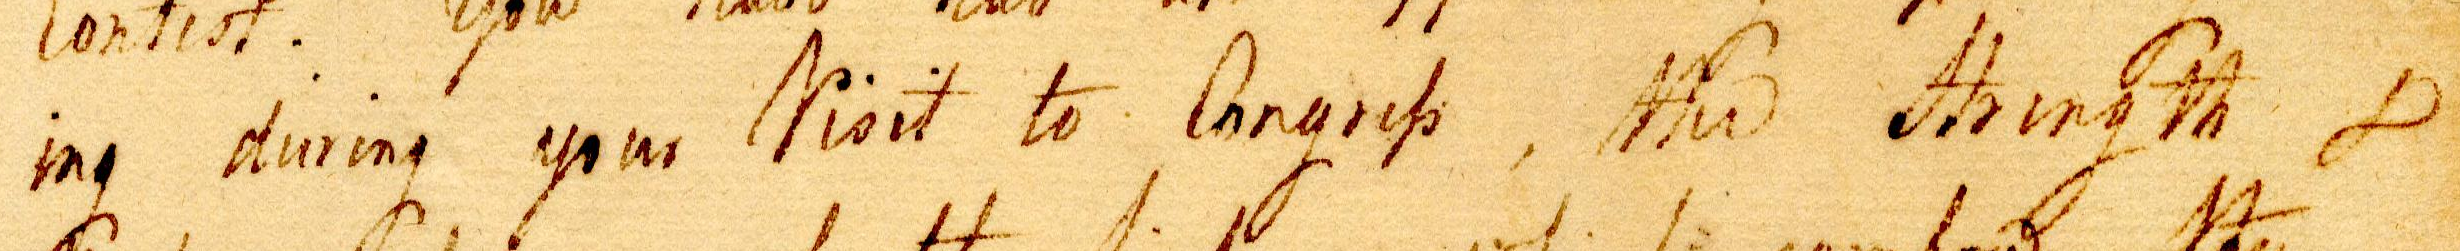ing during your Visit to Congress, the strength &
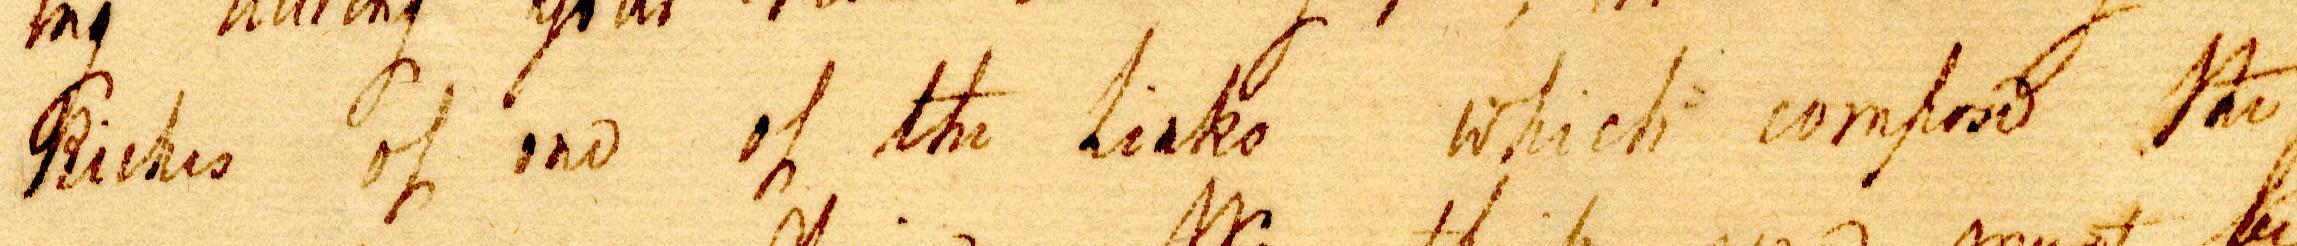Riches of one of the Links which compose the
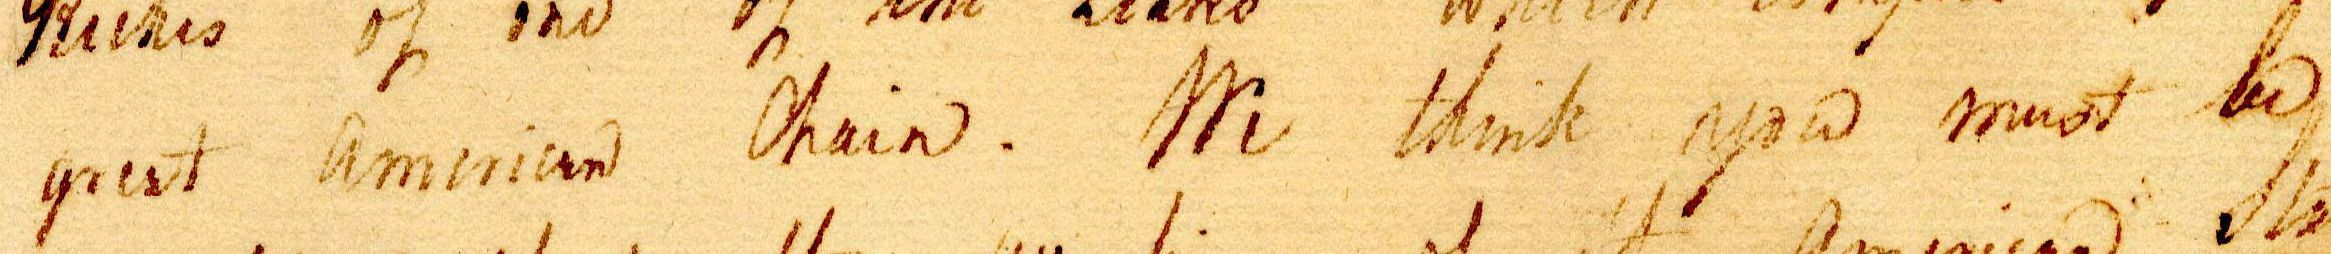great American Chain. We think you must be
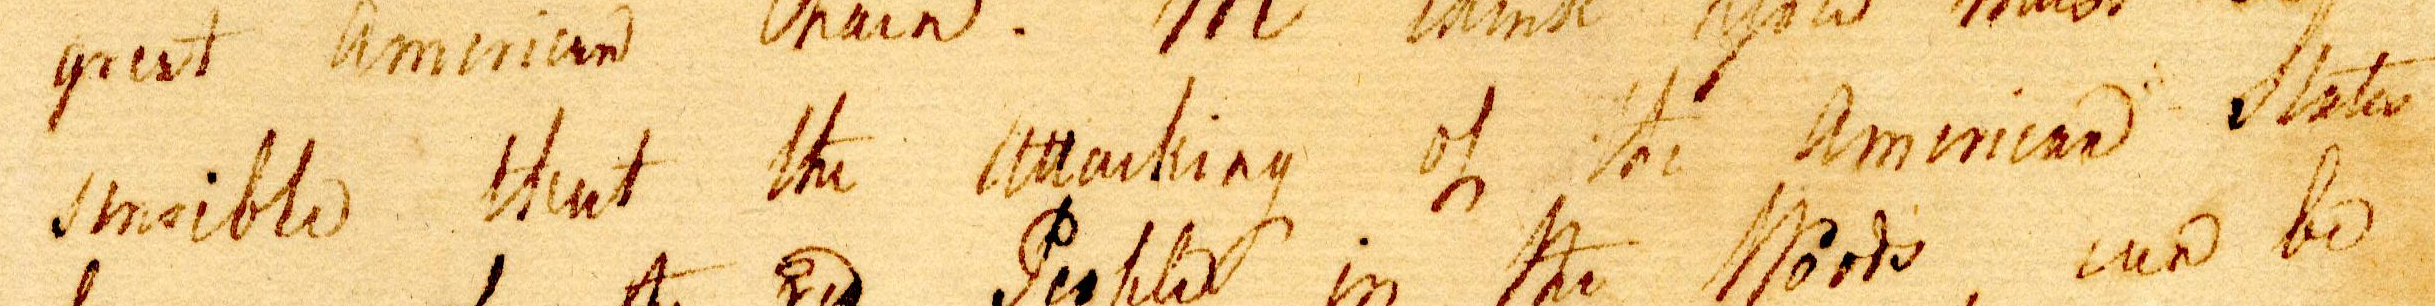sensible that the attacking of the American States
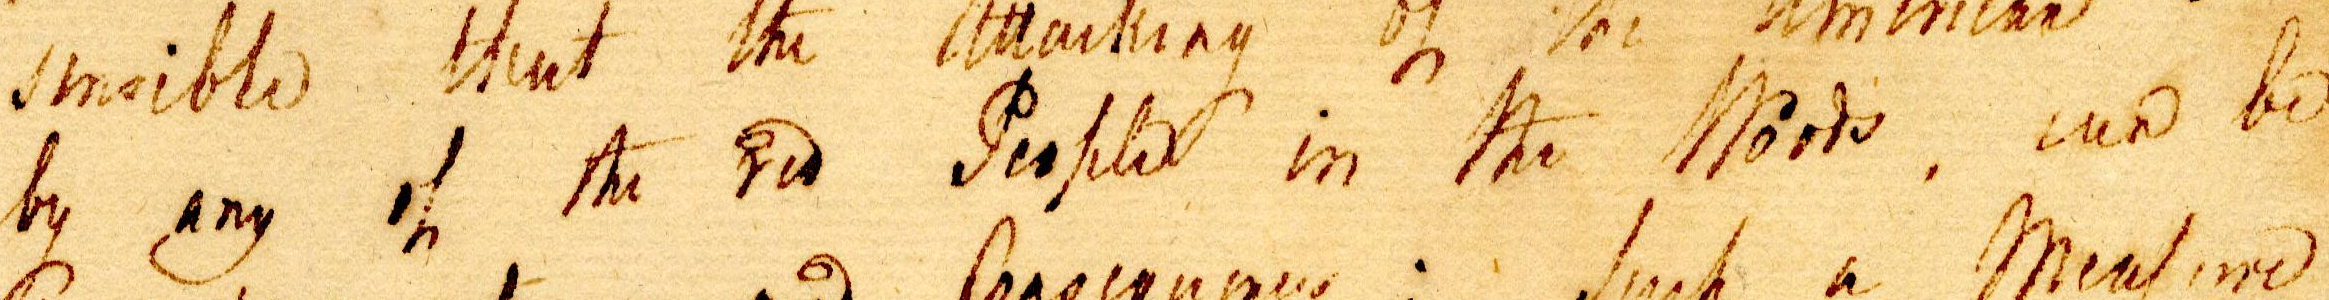by any of the red People in the Woods, can be
